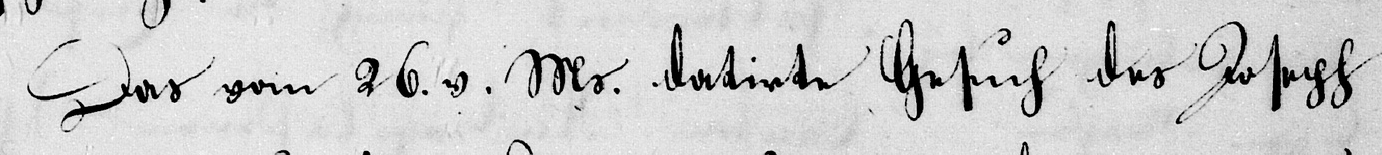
Das vom 26. v. Ms. datirte Gesuch des Joseph
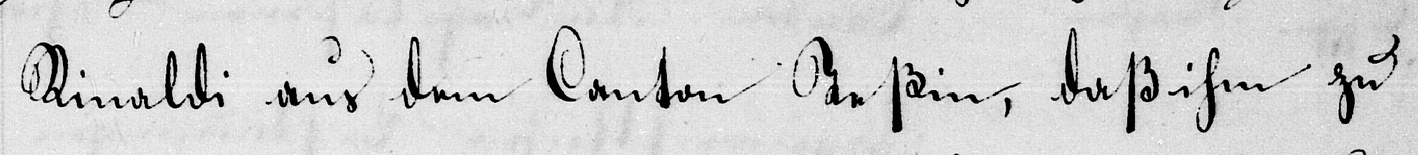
Rinaldi aus dem Canton Teßin, daß ihm zu
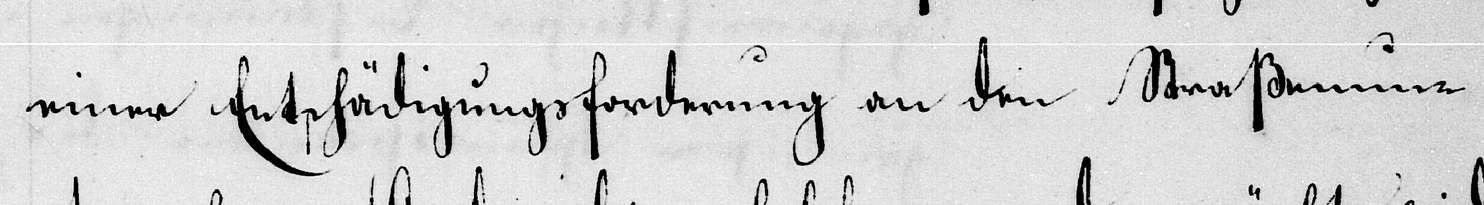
einer Entschädigungsforderung an den Straßenun¬
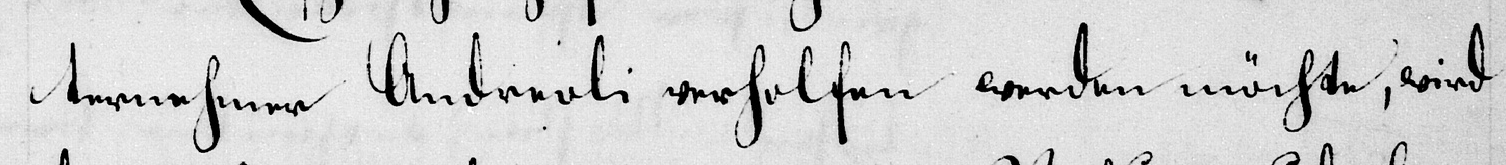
ternehmer Andreoli verholfen werden möchte, wird
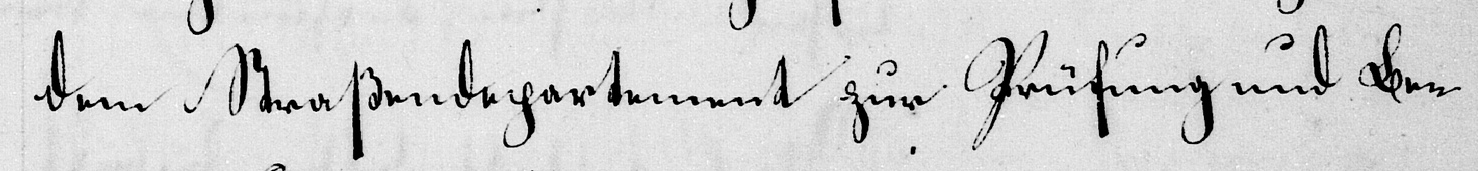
dem Straßendepartement zur Prüfung und Be¬
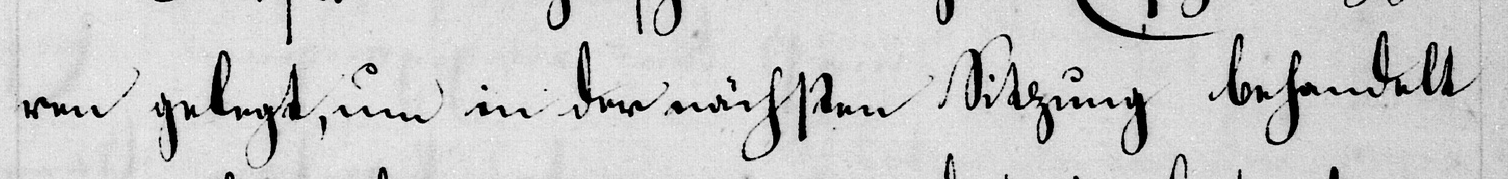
ren gelegt, um in der nächsten Sitzung behandelt
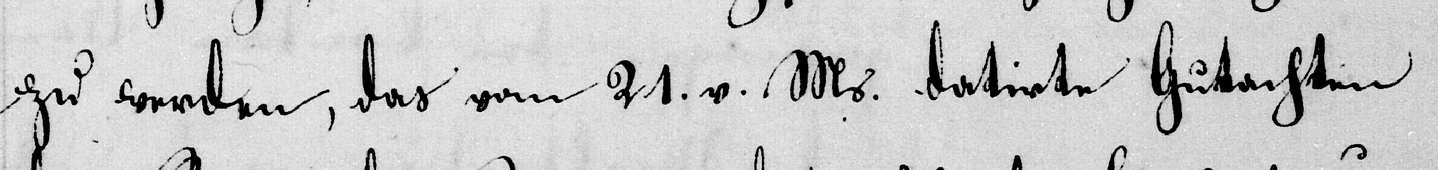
zu werden, das vom 21. v. Ms. datirte Gutachten
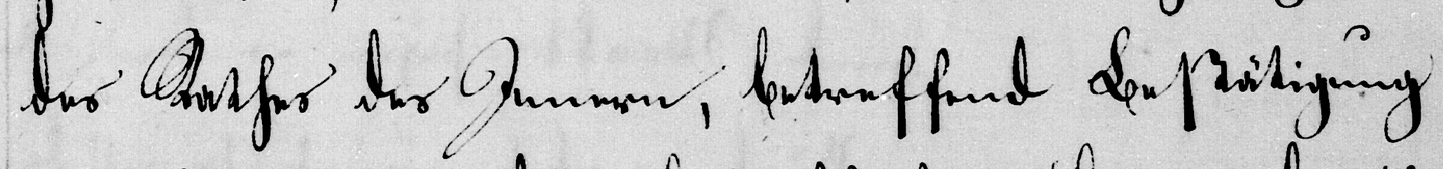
des Rathes des Innern, betreffend Bestätigung
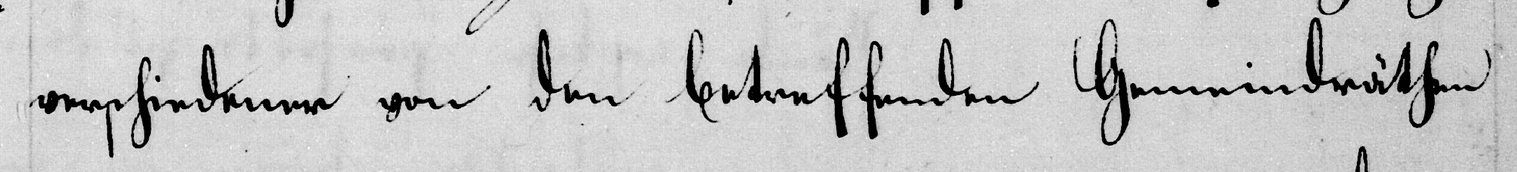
verschiedener von den betreffenden Gemeindräthen
